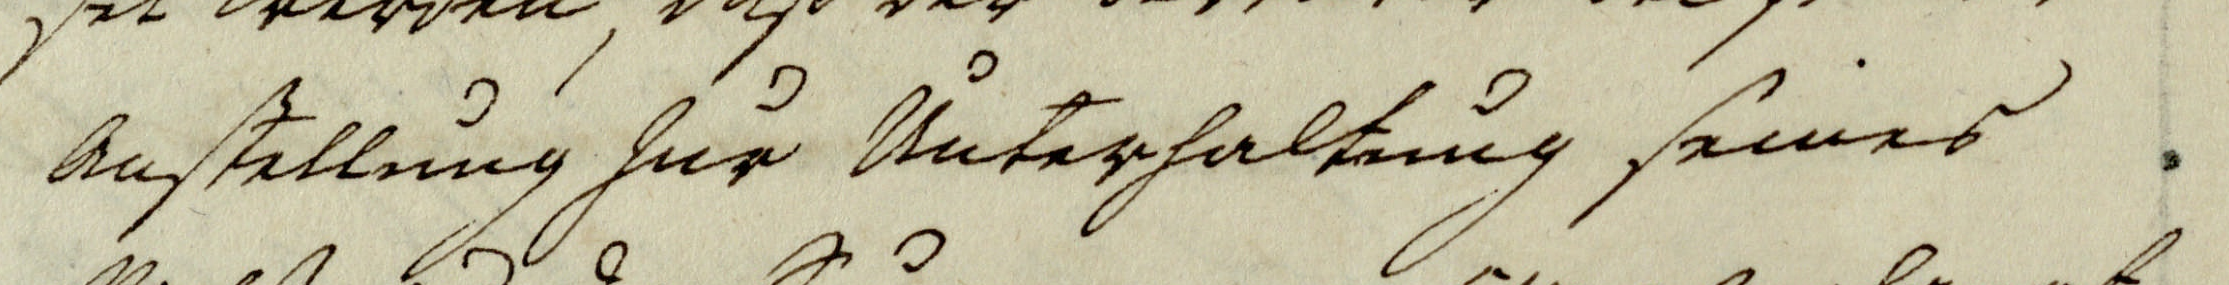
Aufstellung zur Unterhaltung seines
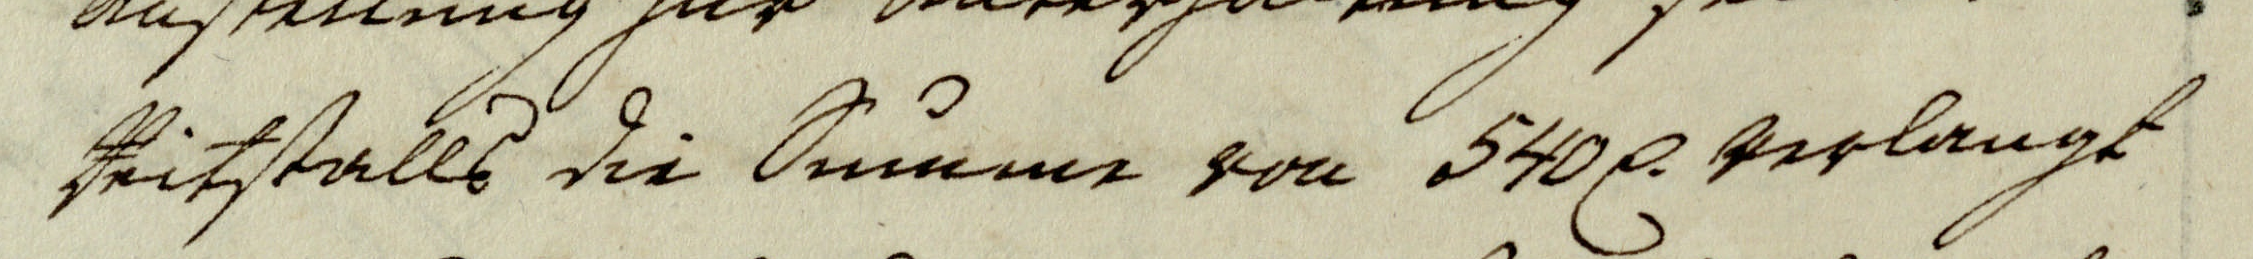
Reitstalls die Summe von 540 rtl. verlangt
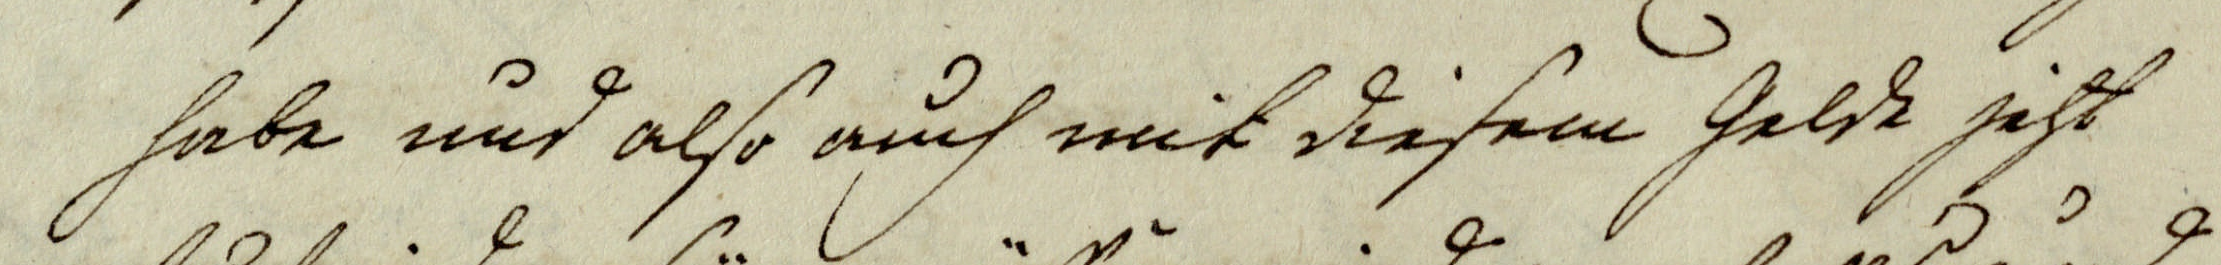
habe und also auch mit diesem Geld jetzt
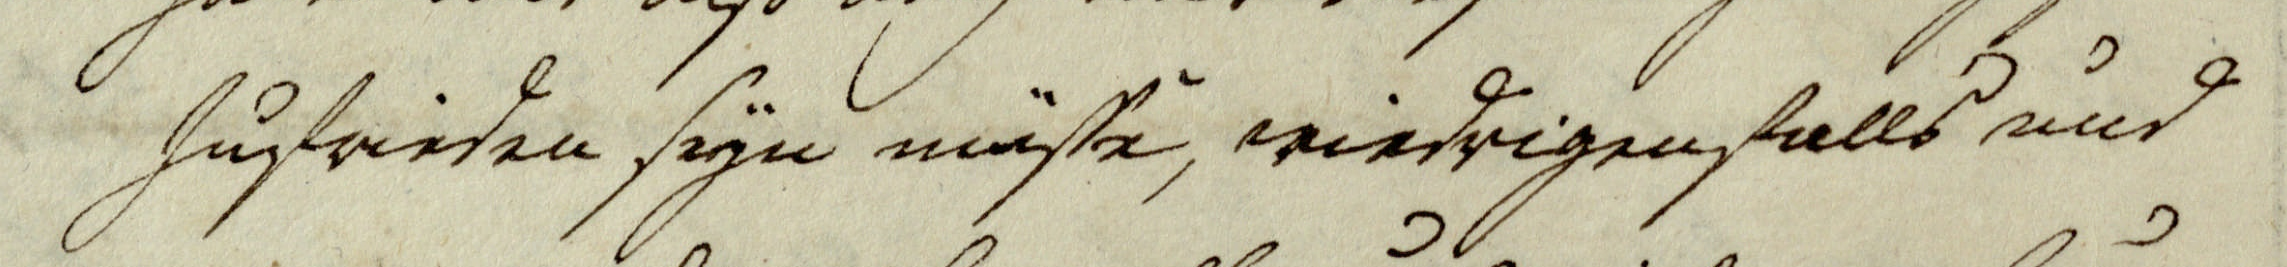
zufrieden seÿn müsse, widrigenfalls und
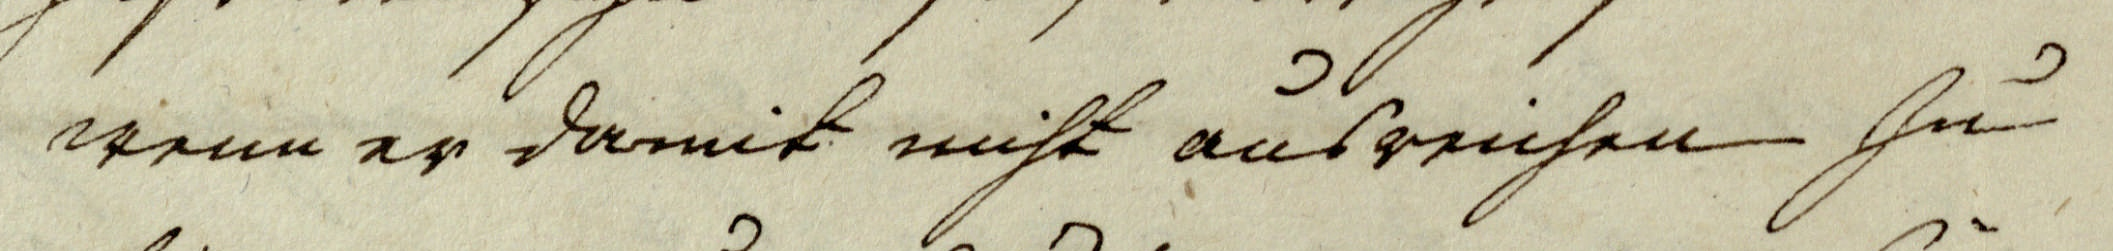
wenn er damit nicht ausreichen zu
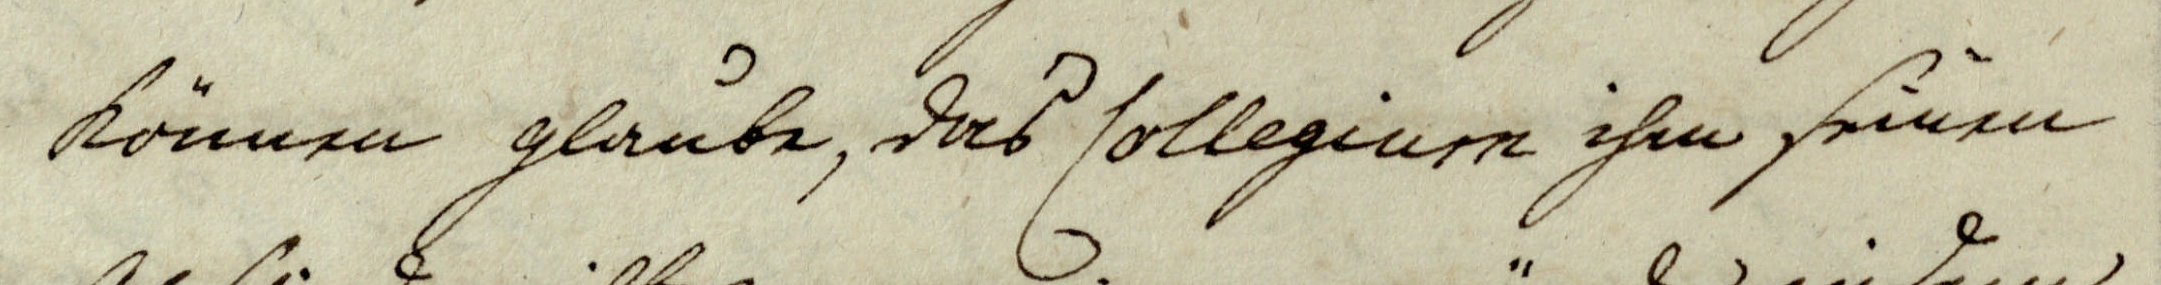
können glaube, das Collegium ihm seinen
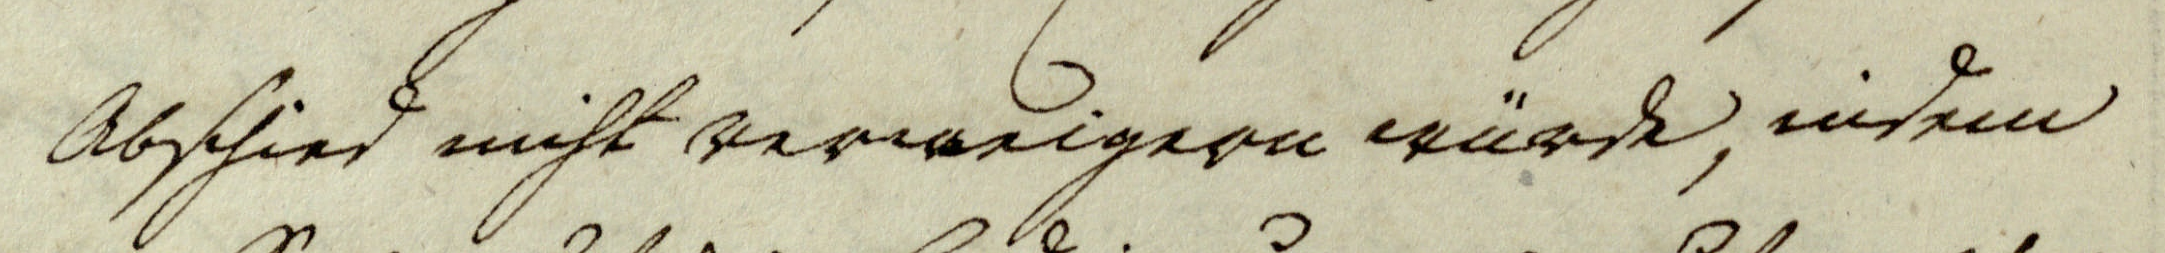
Abschied nicht verweigern würde, indem
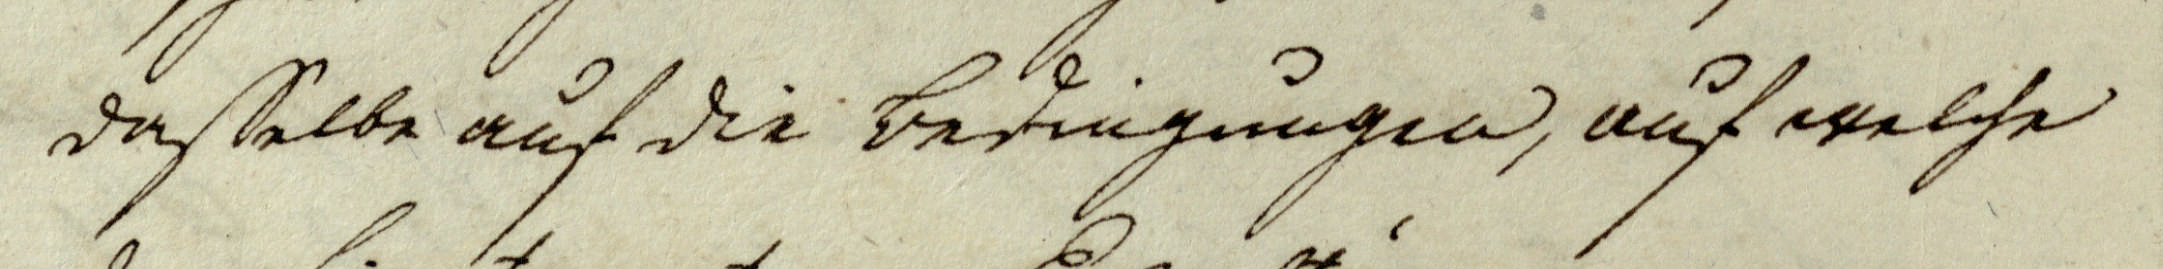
dasselbe auf die Bedingungen, auf welche
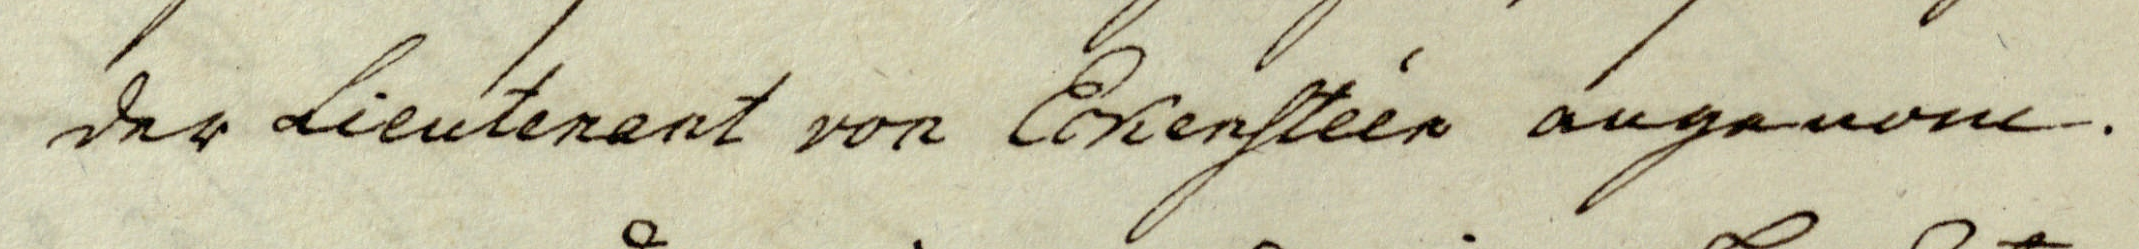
der Lieutenant von Eckensteén angenom¬
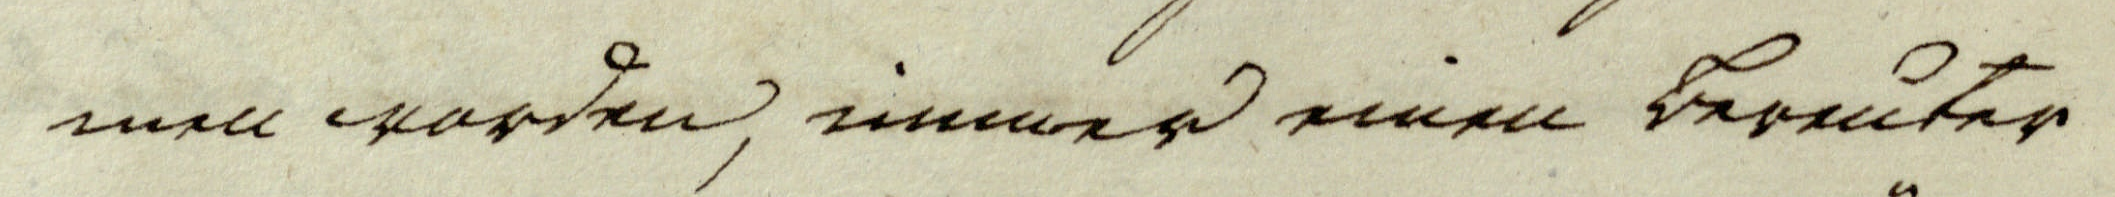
men worden, immer einen Bereuter
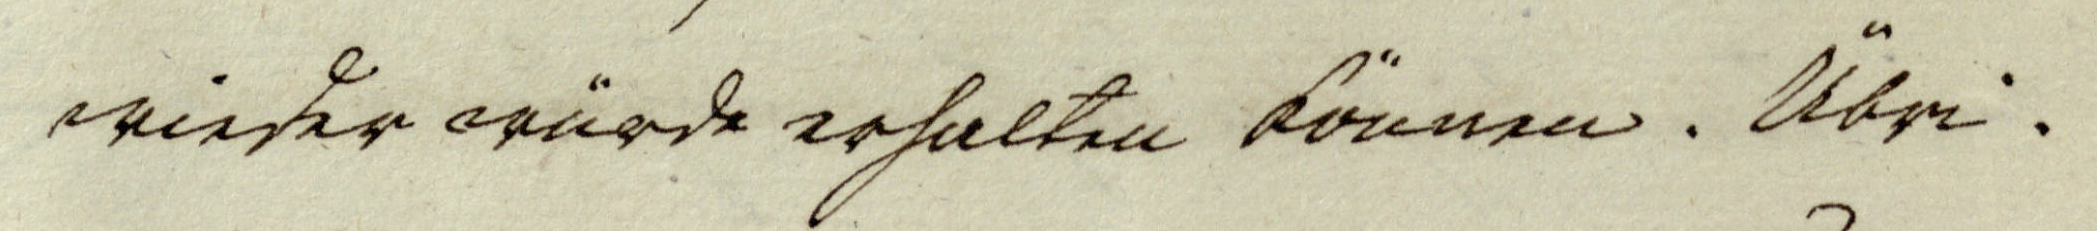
wieder würde erhalten können. Übri¬
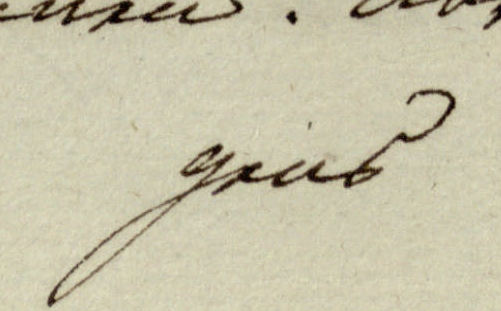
gens
